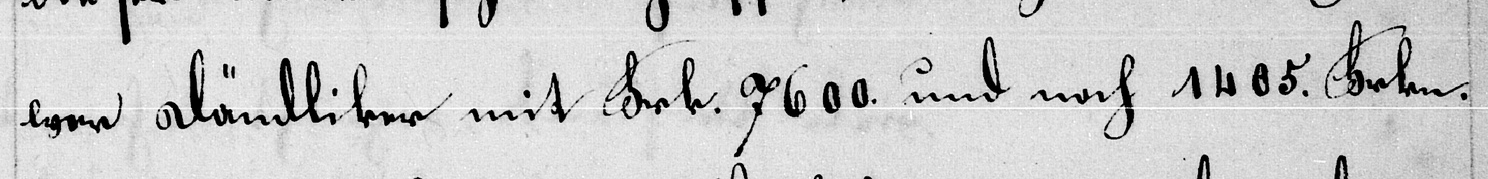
wer Dändliker mit Frk. 7600. und noch 1405. Frkn.
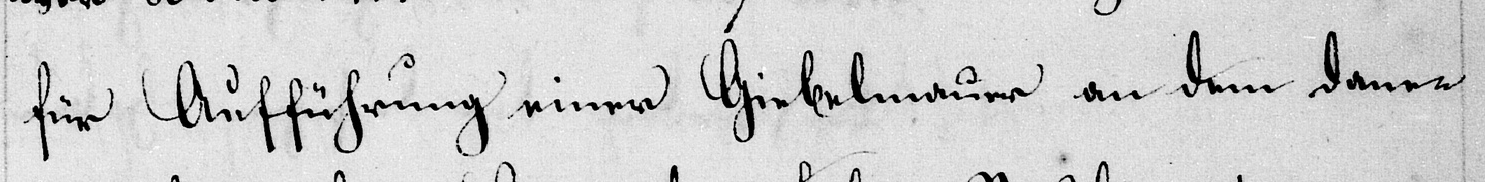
für Aufführung einer Giebelmauer an dem dan¬
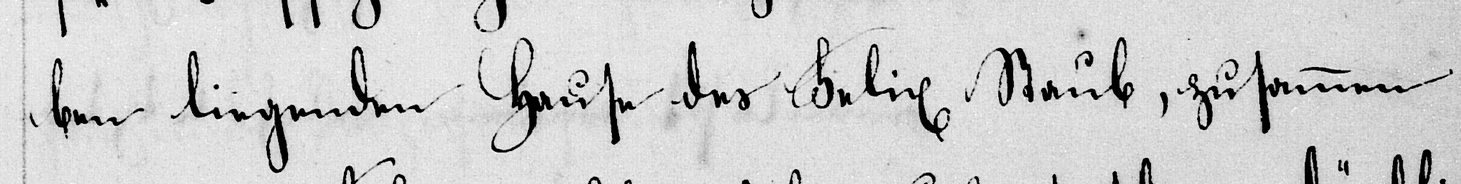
eben liegenden Hause des Felix Staub, zusammen
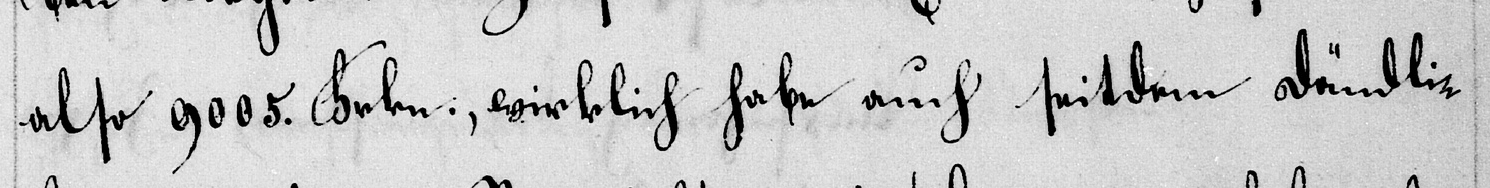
also 9005. Frkn., wirklich habe auch seitdem Dändli¬
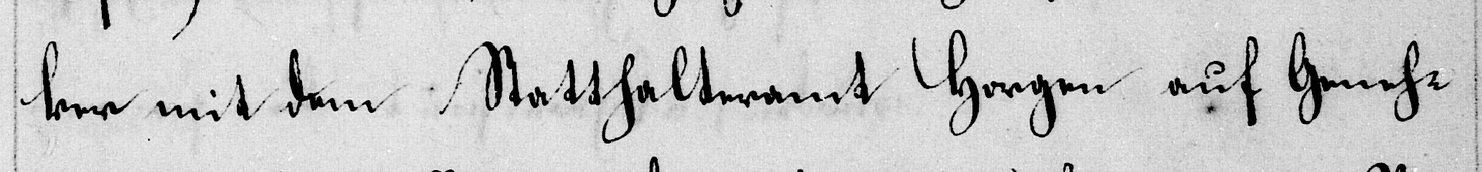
ker mit dem Statthalteramt Horgen auf Geneh¬
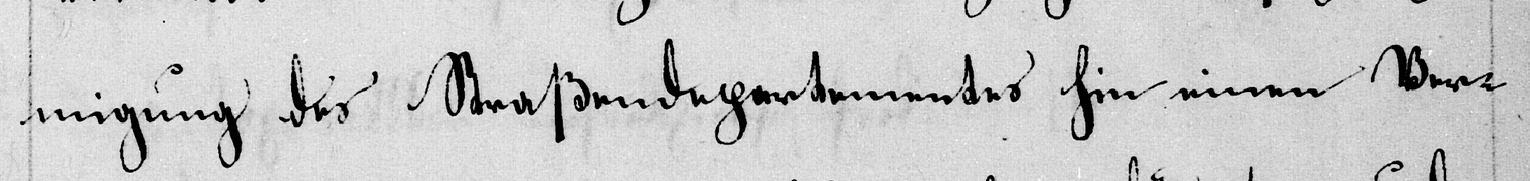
migung des Straßendepartementes hin einen Ver¬
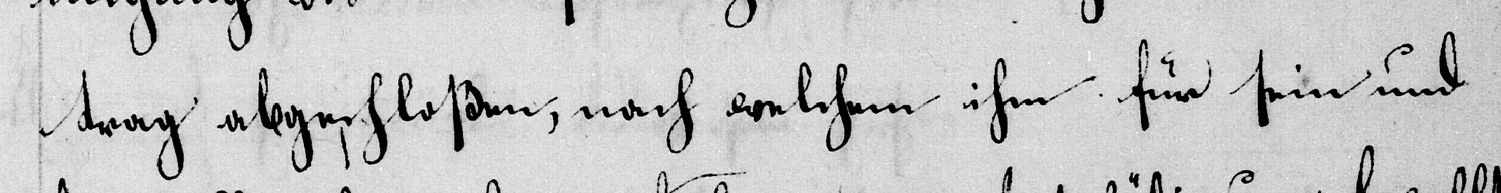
trag abgeschloßen, nach welchem ihm für sein und
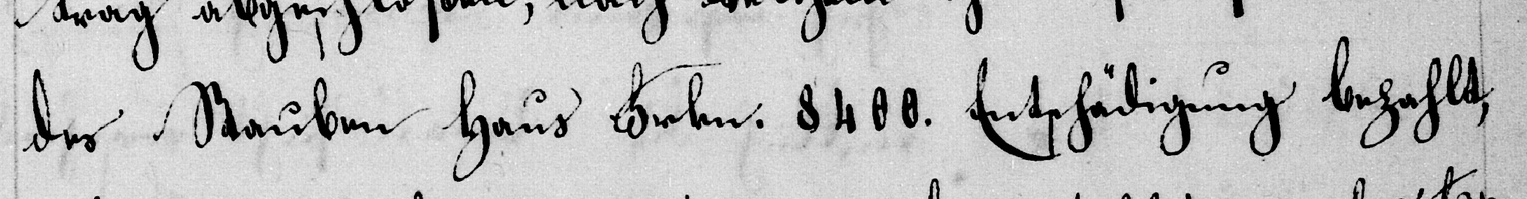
des Stauben Haus Frkn. 8400. Entschädigung bezahlt,
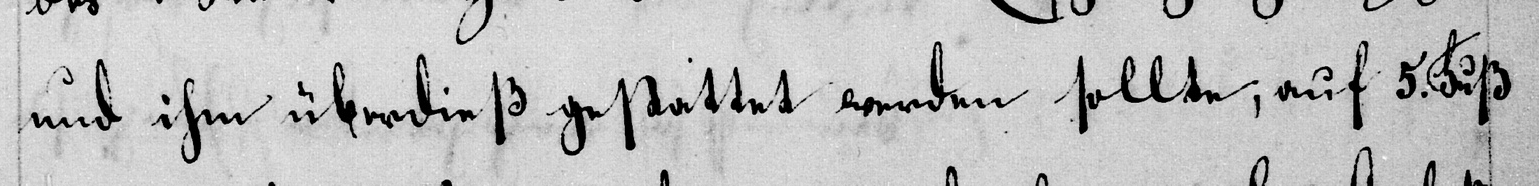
und ihm überdieß gestattet werden sollte, auf 5. Fuß
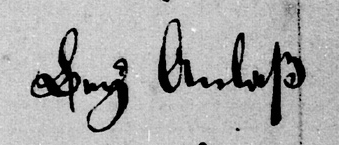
Bey Anlaß
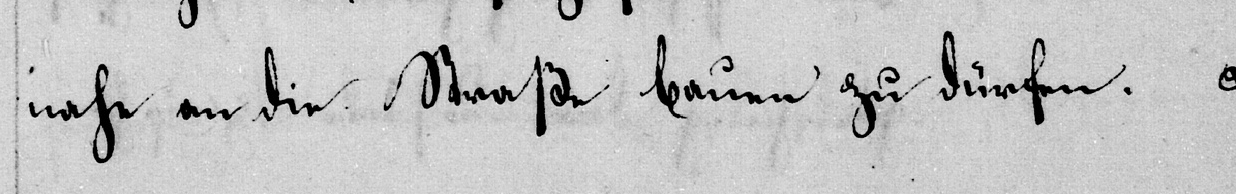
nahe an die Straße bauen zu dürfen.
